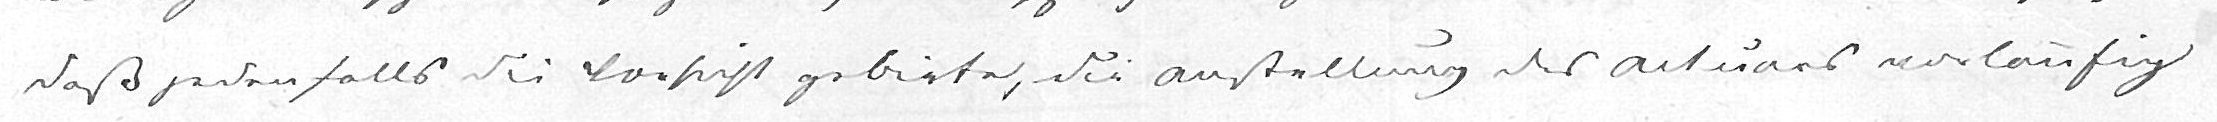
daß jedenfalls die Vorsicht gebiete, die Anstellung des Actuars vorlufig
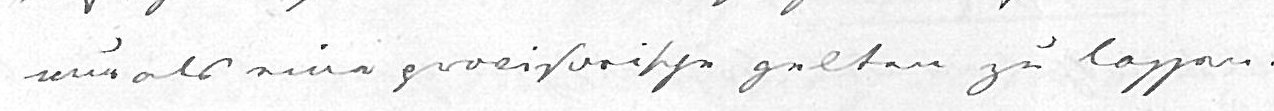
nur also eine provisorische gelten zu lassen.
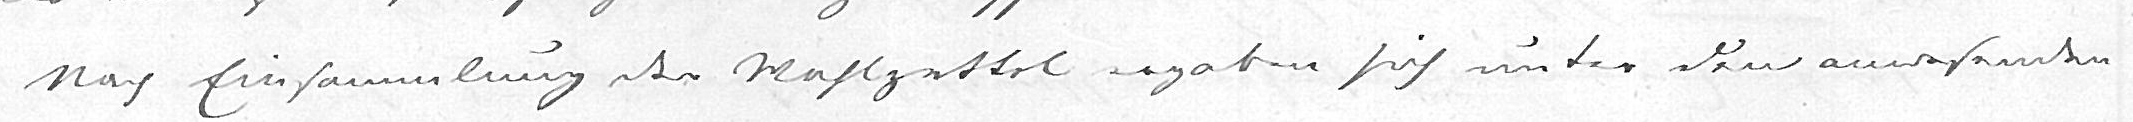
Nach Einsammlung der Wahlzettel ergaben sich unter den anwesenden
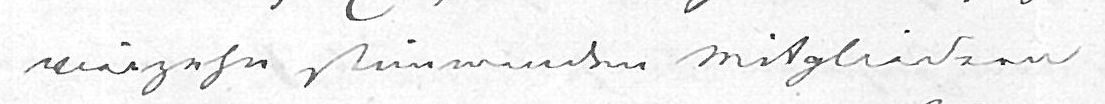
vierzehn stimmenden Mitgliedern
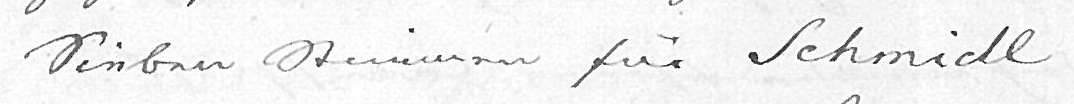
Sieben Stimmen für Schmidl
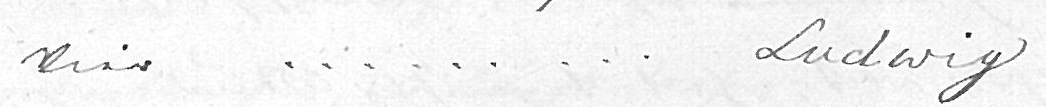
vier . . . . . . . . . Ludwig
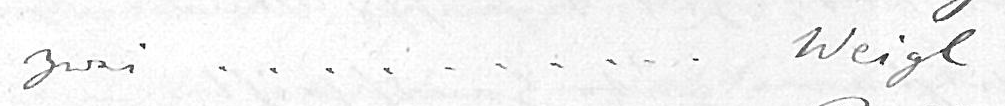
zwei . . . . . . . . . Weigl
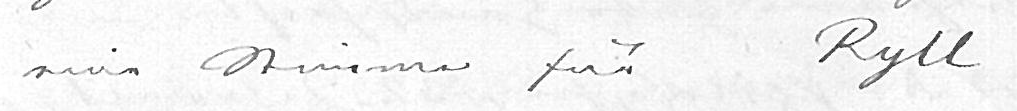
eine Stimme für Ryll
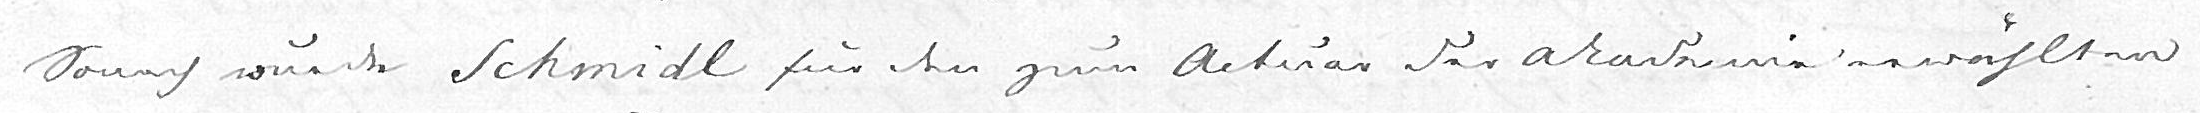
Sonach wurde Schmidl für den zum Actuar der Akademie erwählten
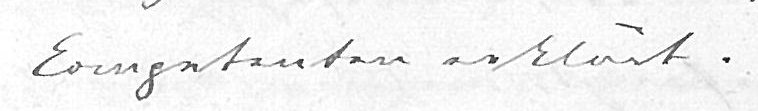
Competenten erklärt.
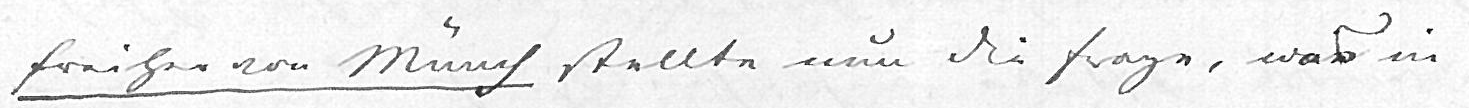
Freiherr von Münch stellte nun die Frage, was in
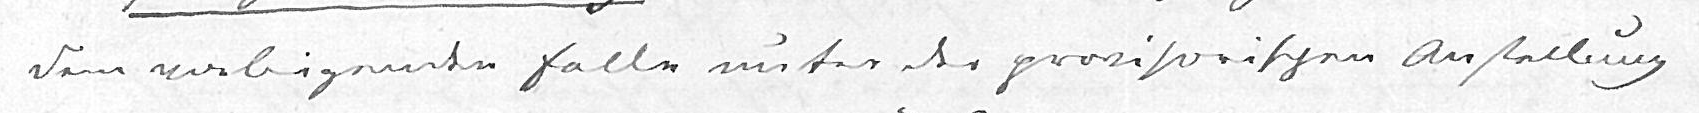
dem vorligenden Falle unter der provisorischen Anstellung
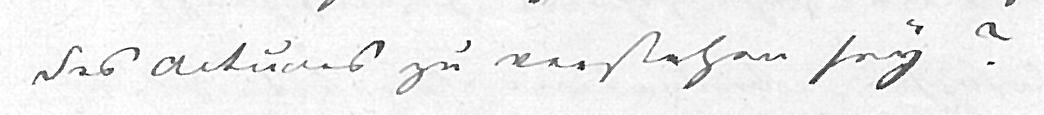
des Actuars zu verstehen sey?
